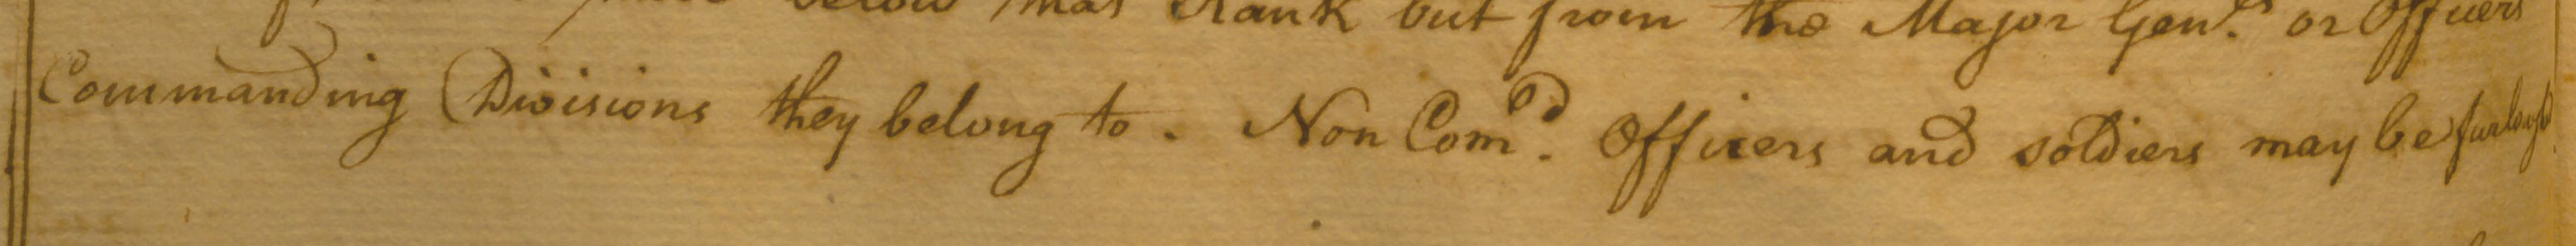Commanding Divisions they belong to. Non Com^d. Officers and soldiers may be furloughed
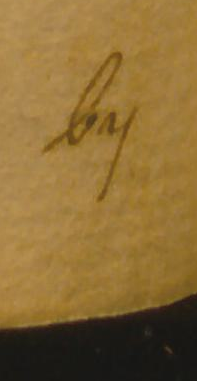by
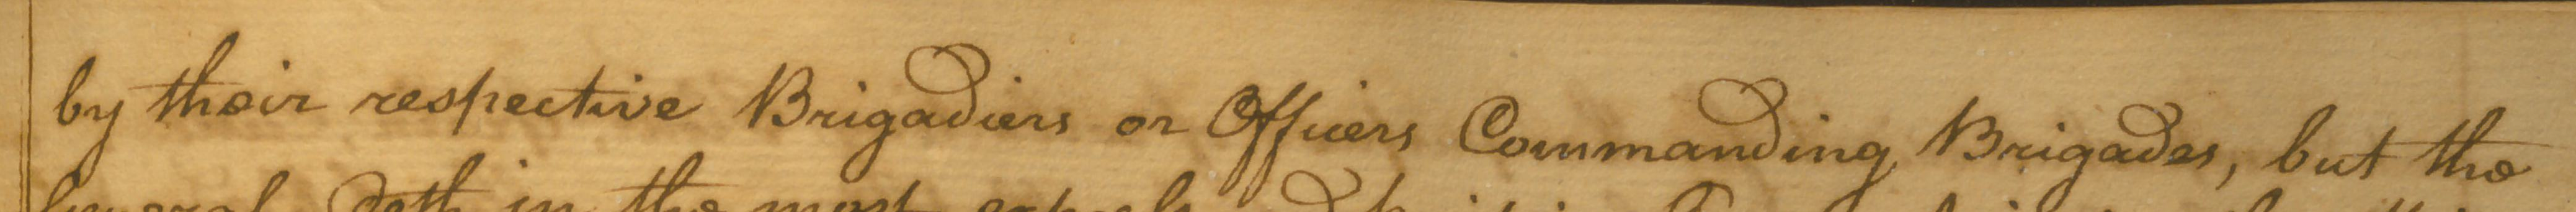by their respective Brigadiers or Officers Commanding Brigades, but the
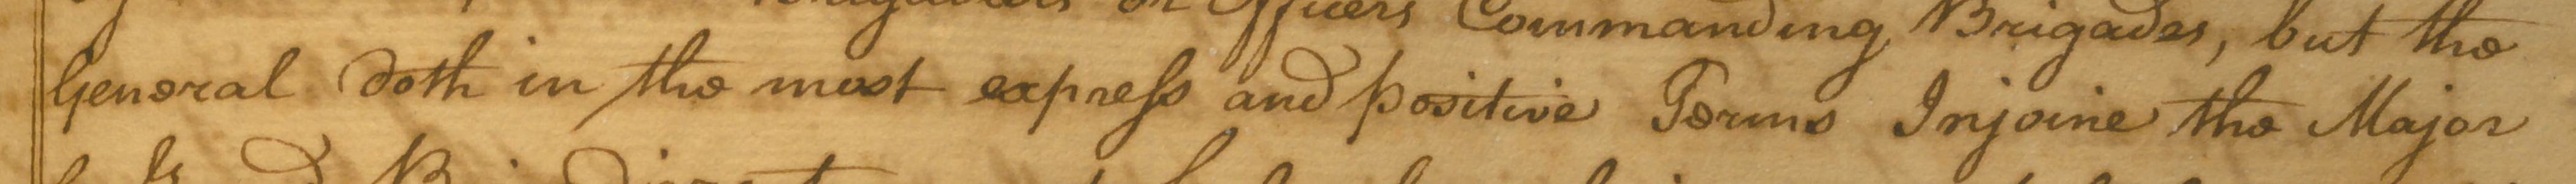General doth in the most express and positive Terms Injoine the Major
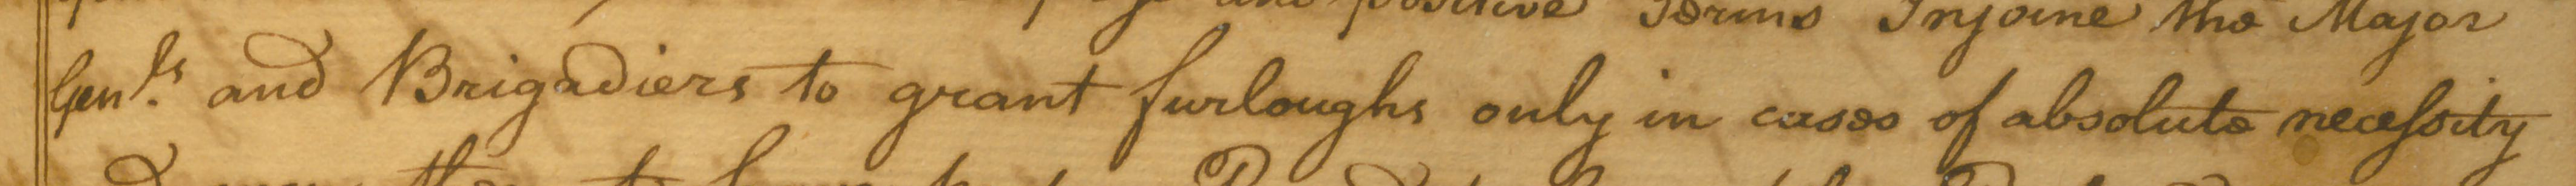Gen^ls. and Brigadiers to grant furloughs only in cases of absolute necessity
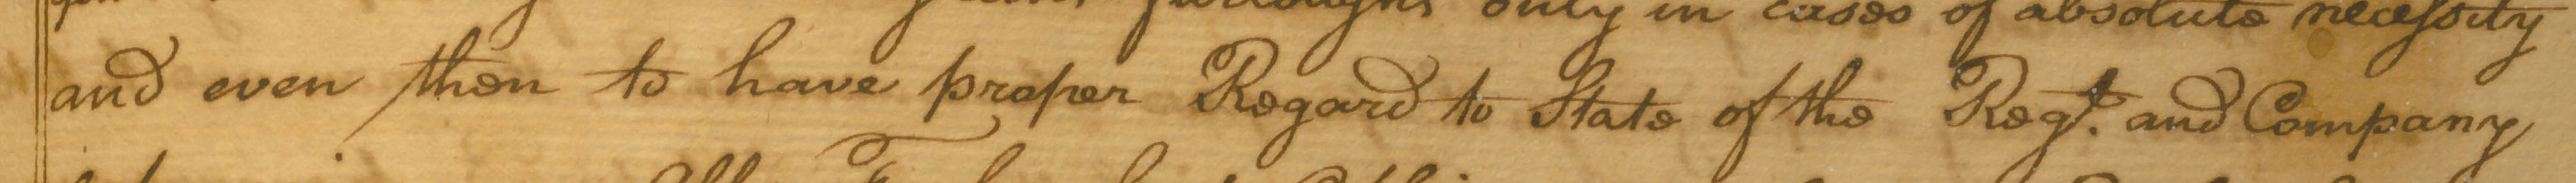and even then to have proper Regard to State of the Reg^t. and Company
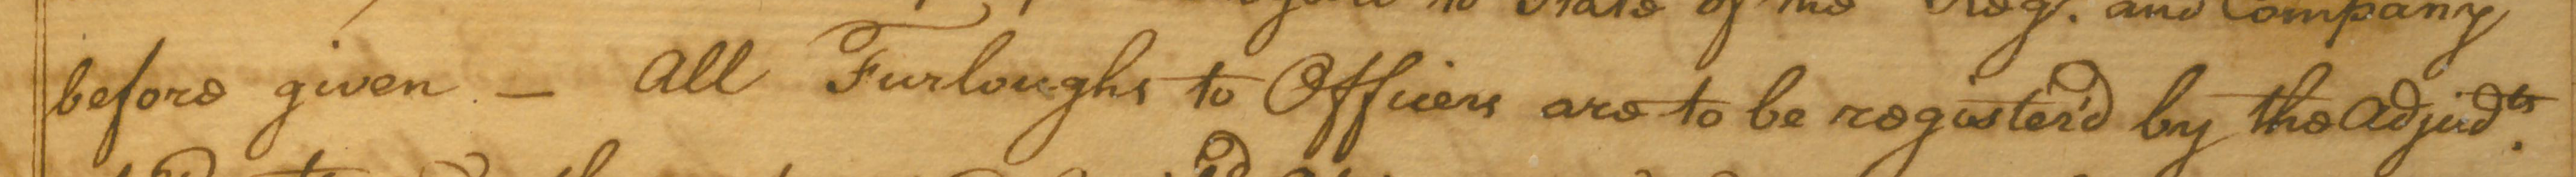before given- All Furloughs to Officers are to be register'd by the Adjud^ts.
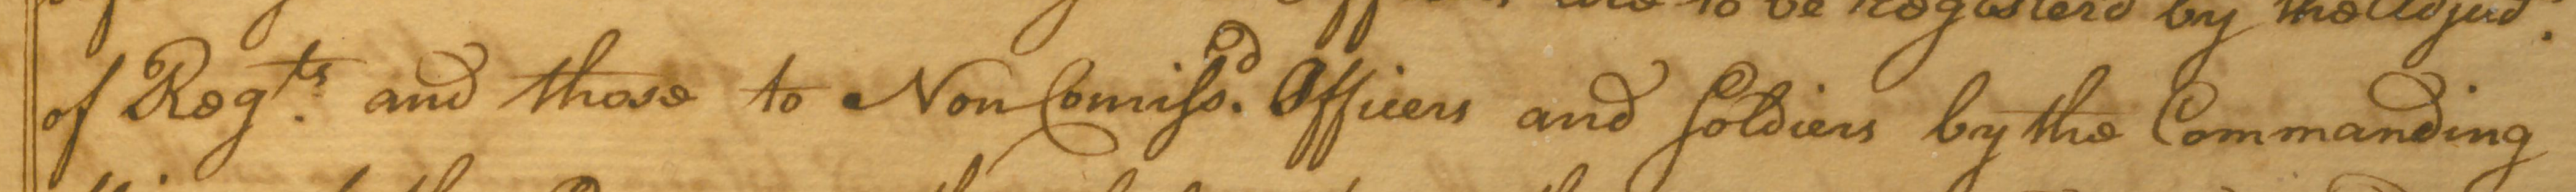of Reg^ts. and those to Non Commiss^d. Officers and Soldiers by the Commanding
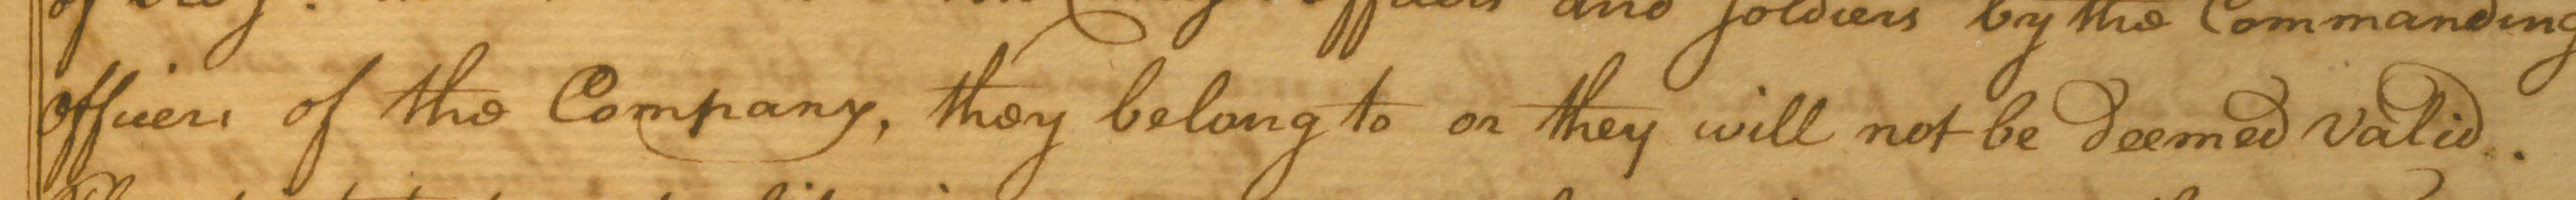Officers of the Company they belong to or they will not be deemed valid.
